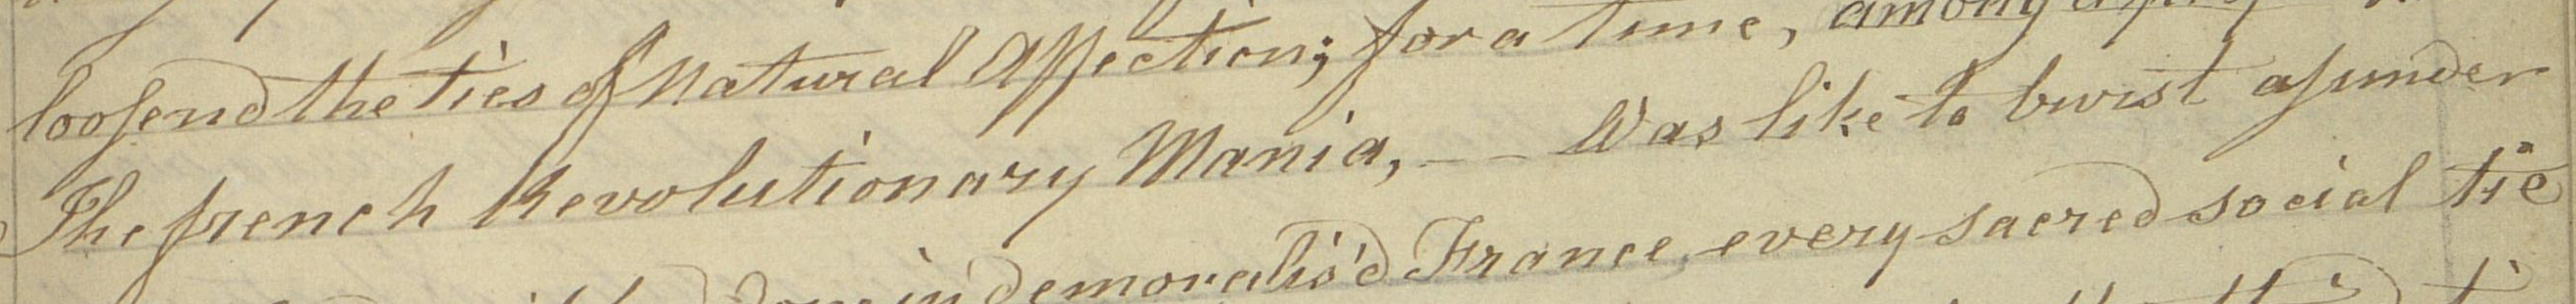The french Revolutionary Mania, Was like to twist asunder
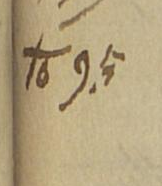to 9^th
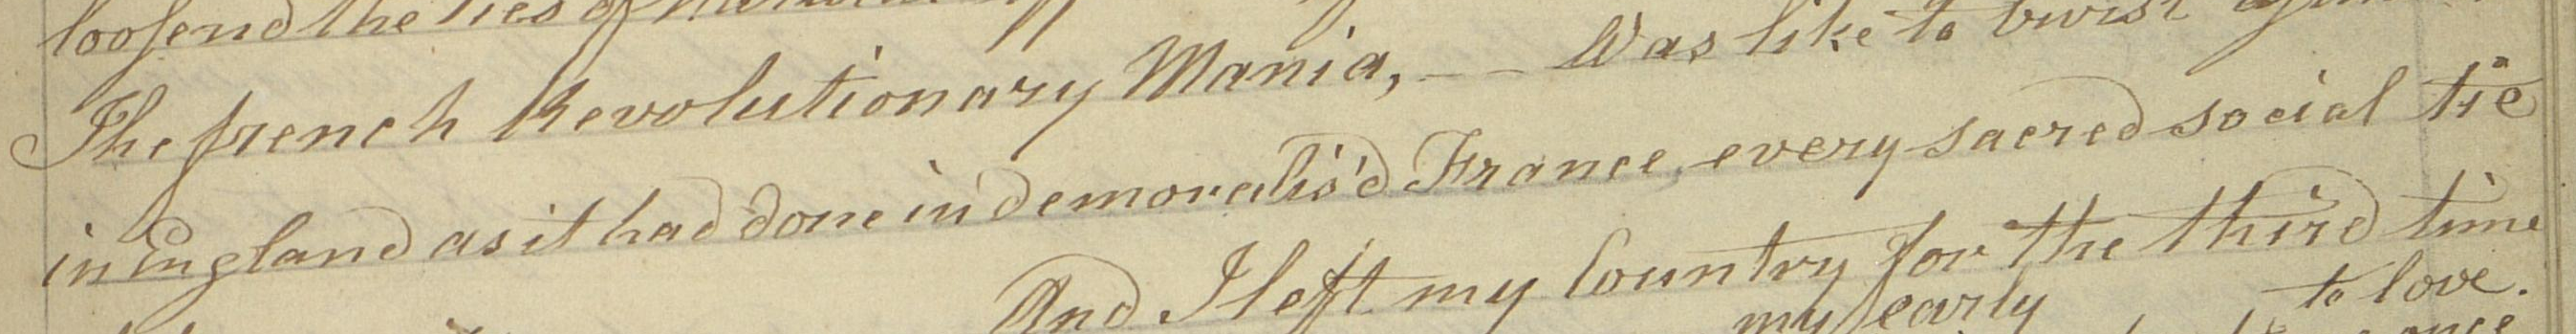in England as it had done in demoralis'd France every sacred social tie
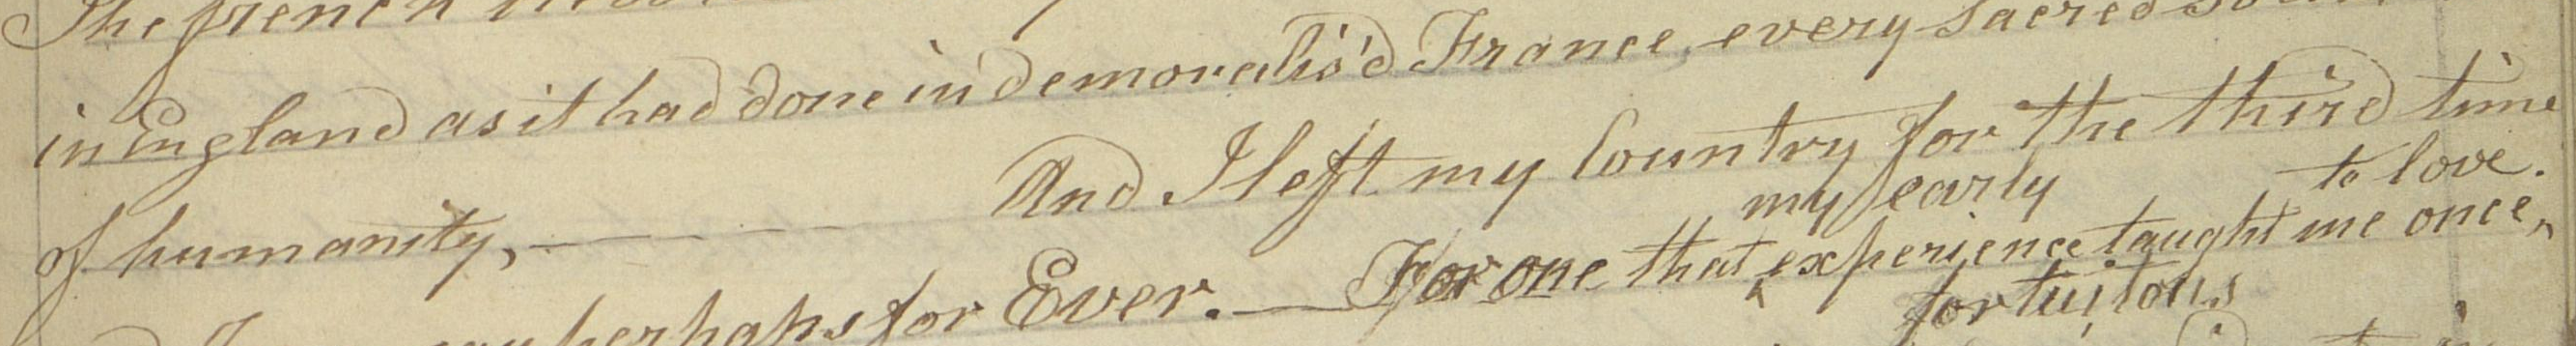of humanity, And I Ieft my Country for the third time
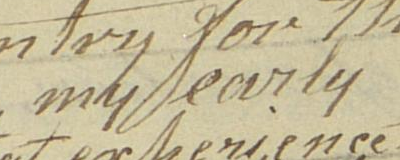my early
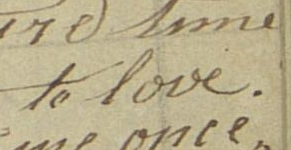to love.
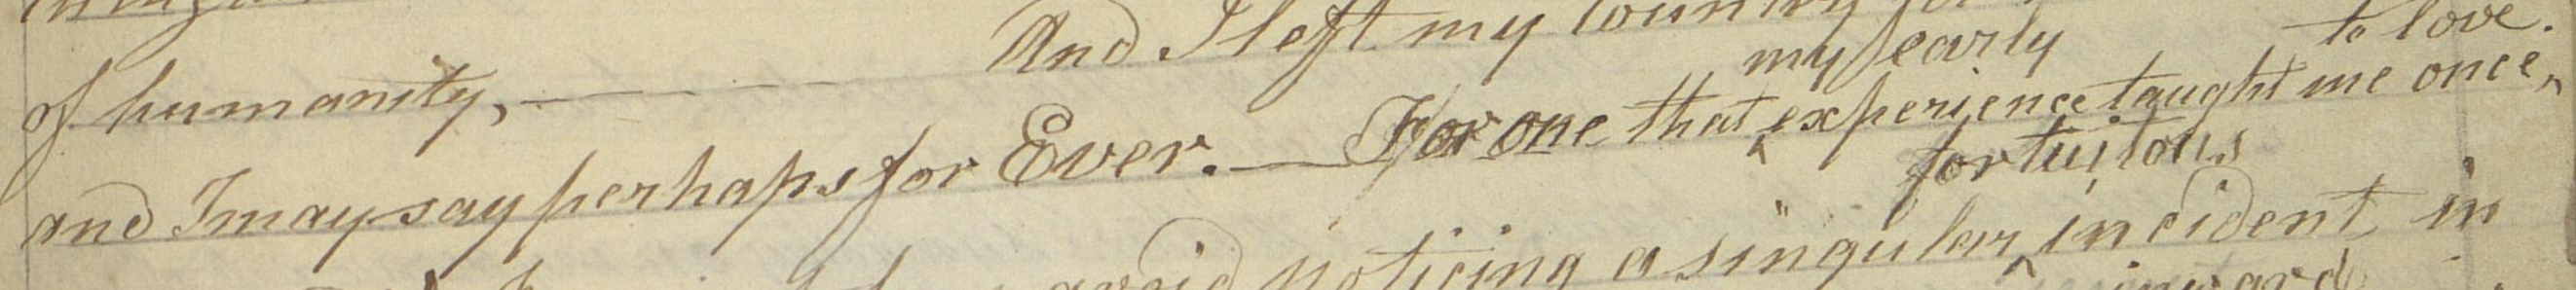and I may say perhaps for Ever. For one that ^ experience taught me once ^
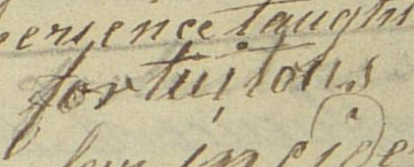fortuitous
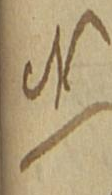N
